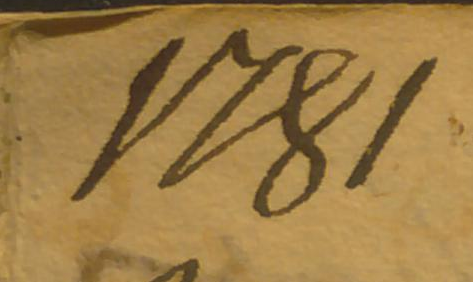1781
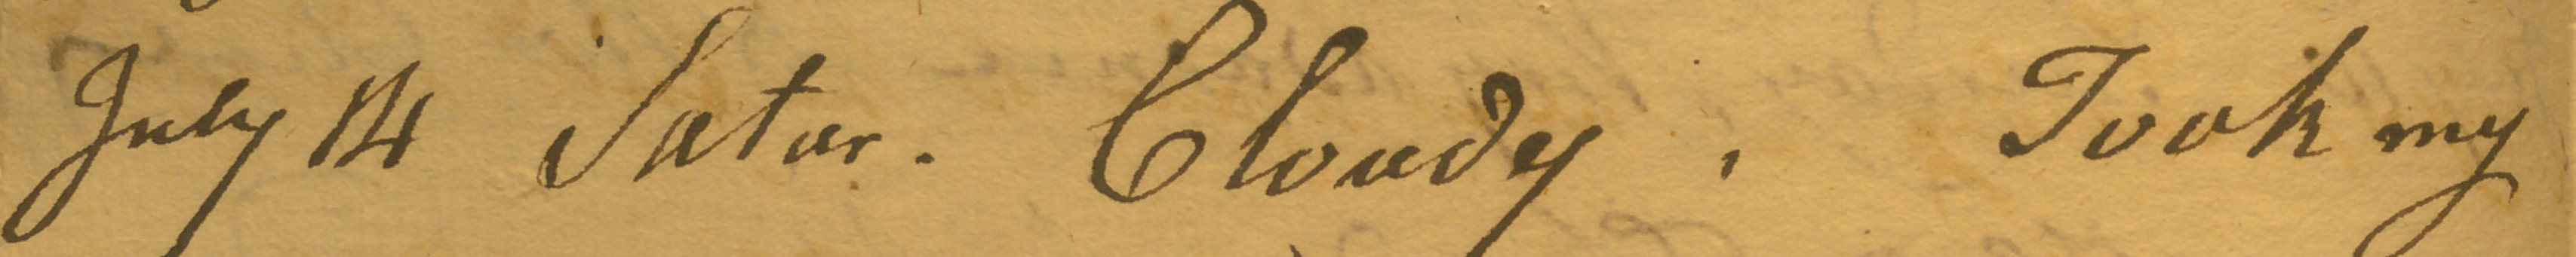July 14 Satur. Cloudy. Took my
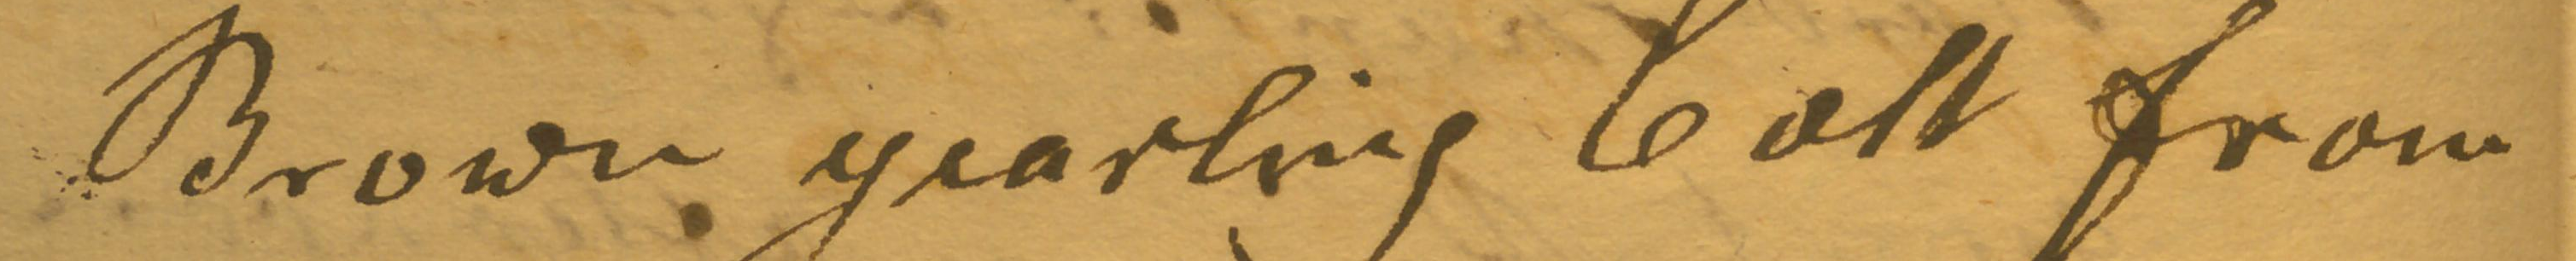rown yearling Colt from
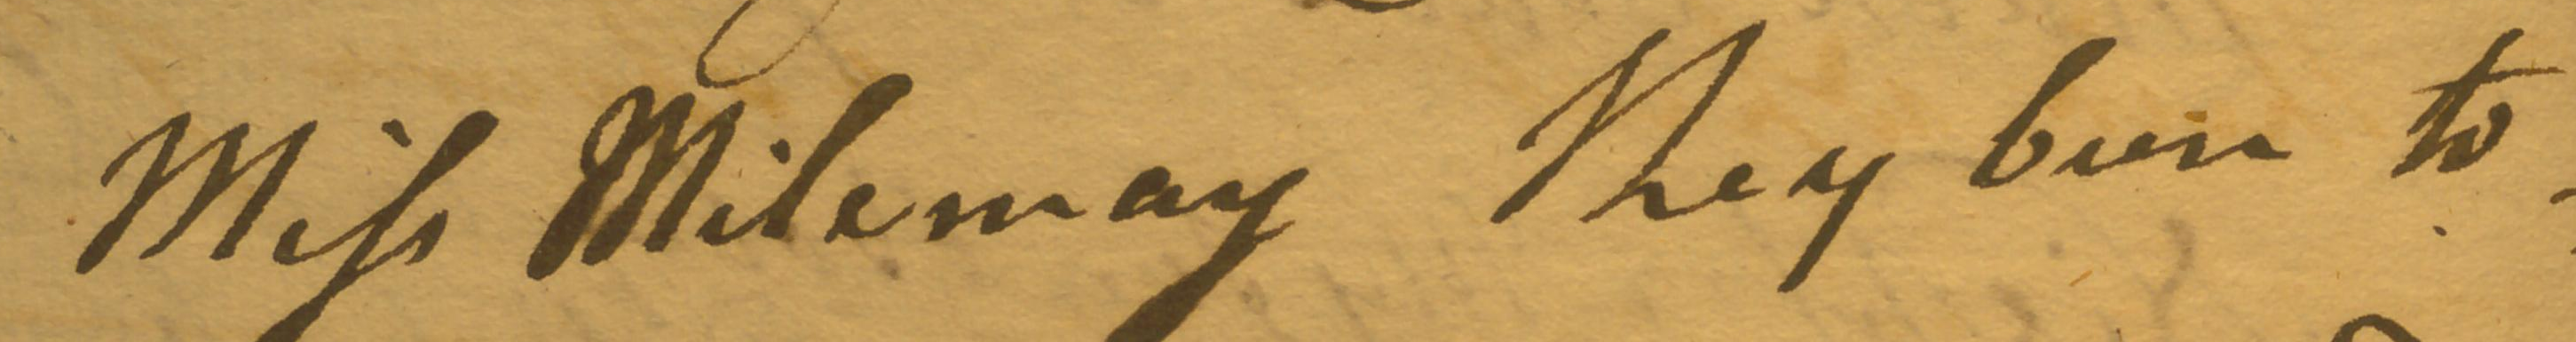Miss Milemay They been to
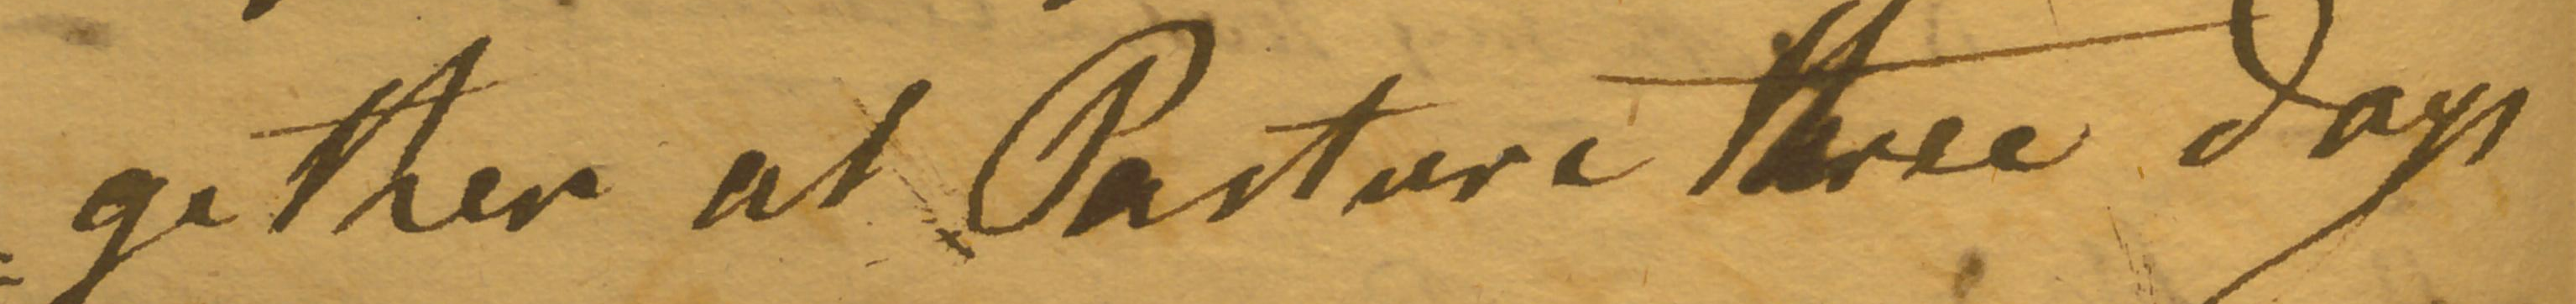gether at Pasture three days
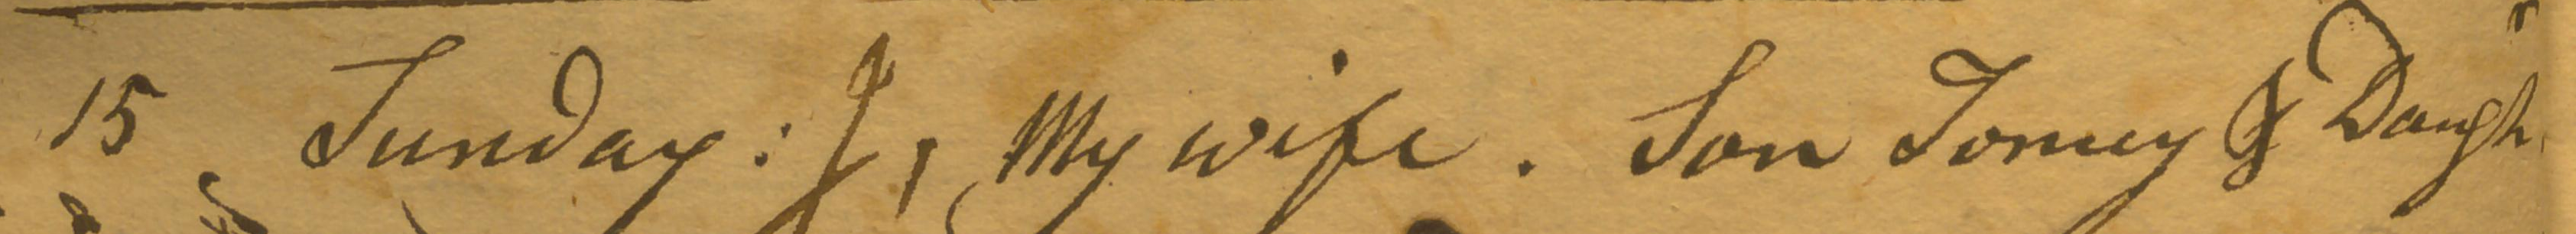15 Sunday: I, My wife. Son Tomey &th Daugh^r
